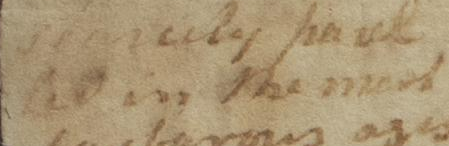lel in the most
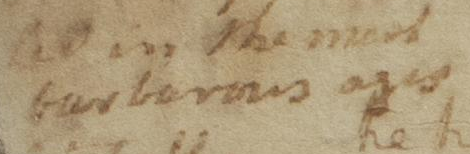barbarous ages
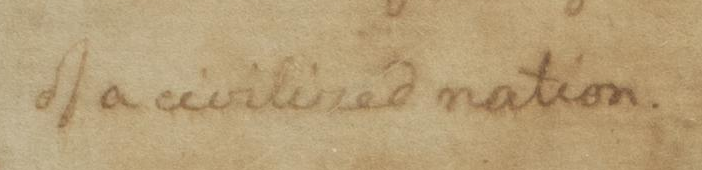of a civilized nation.
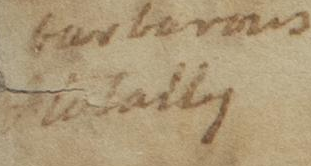totally
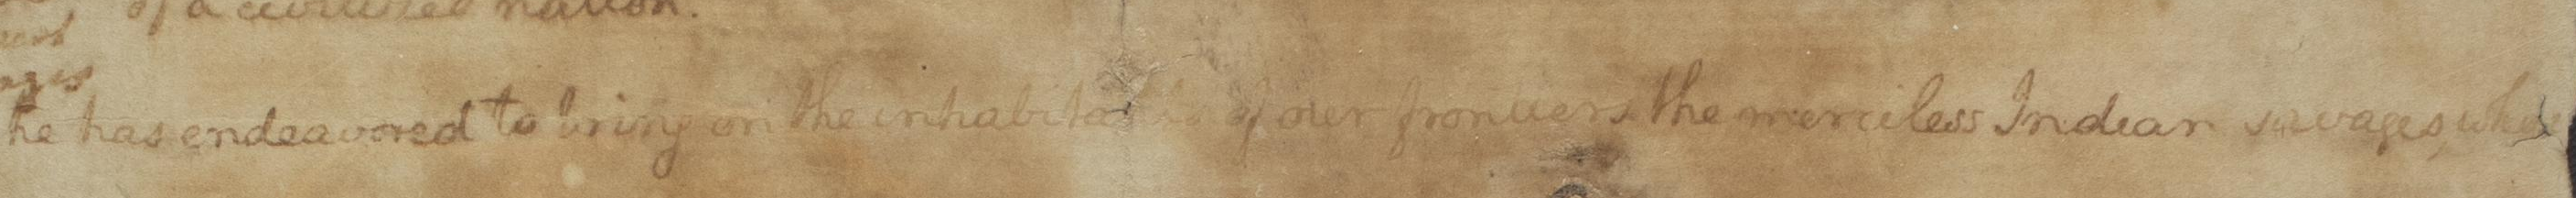He has endeavored to bring on the inhabitants of our frontiers the merciless Indian savages, who
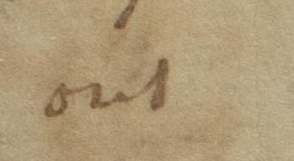out
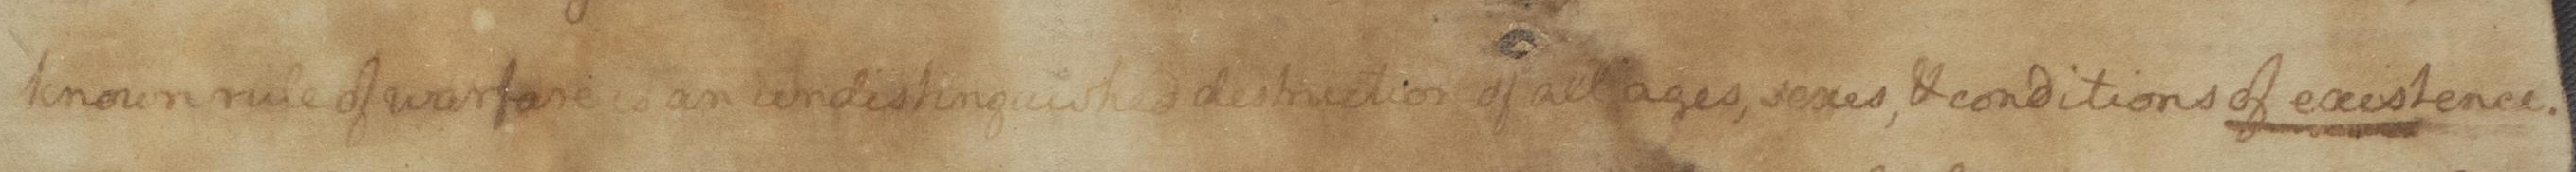known rule of warfare is an undistinguished destruction of all ages, sexes & conditions of existence
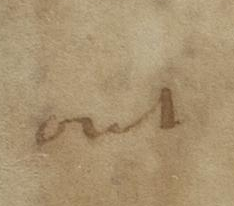out
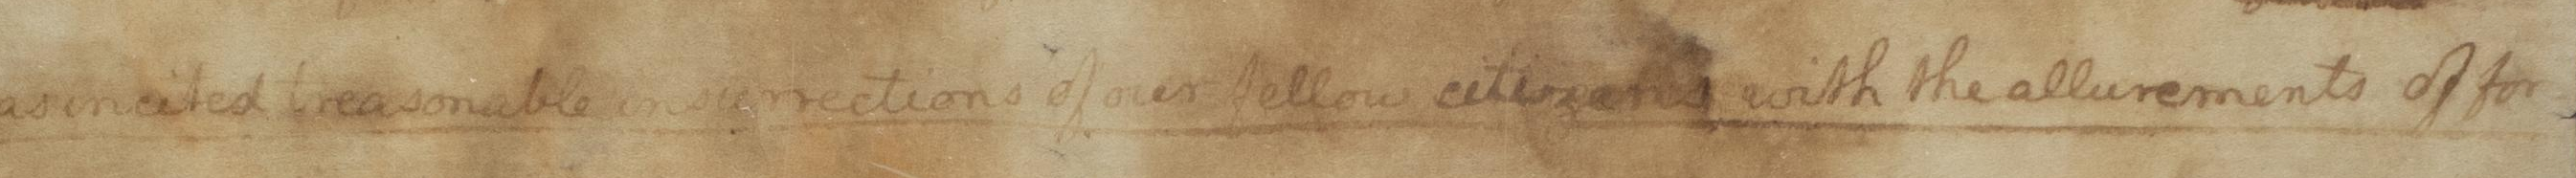as united treasonable expectations of our fellow citizens with the allurements of for
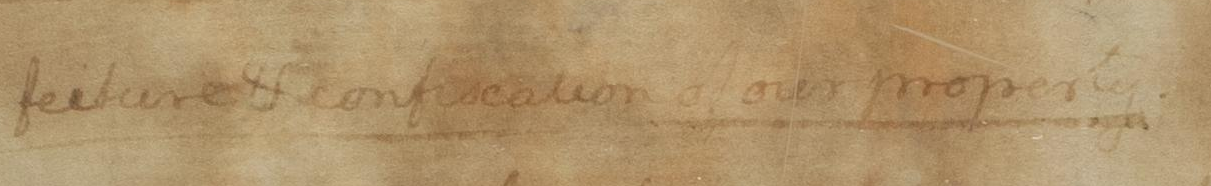feature & consecation
